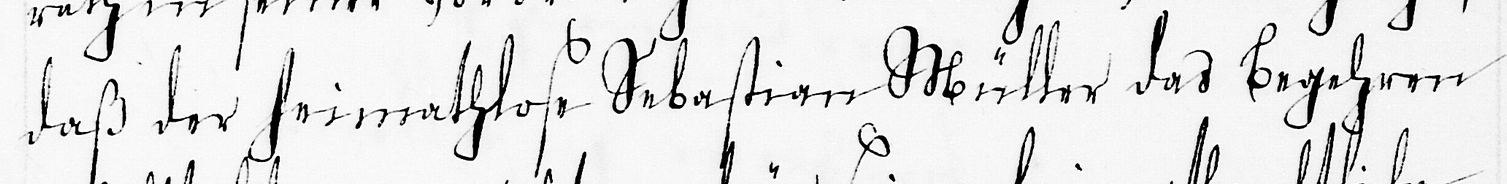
daß der heimathlose Sebastian Müller das Begehren
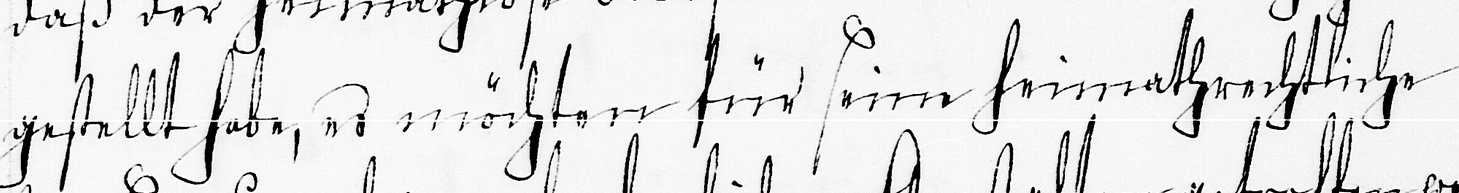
estellt habe, es möchten für seine heimathrechtliche
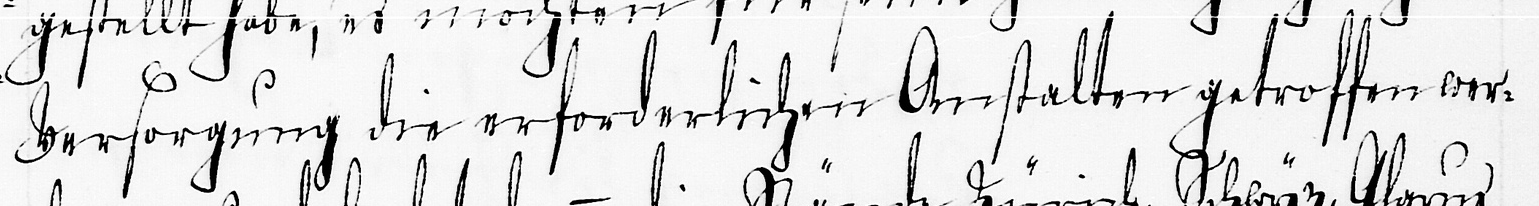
Versorgung die erforderlichen Anstalten getroffen wer¬
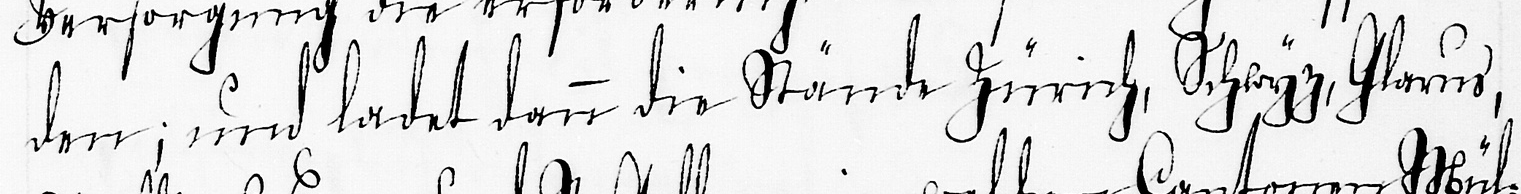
den; und ladet dann die Stände Zürich, Schwyz, Glarus,
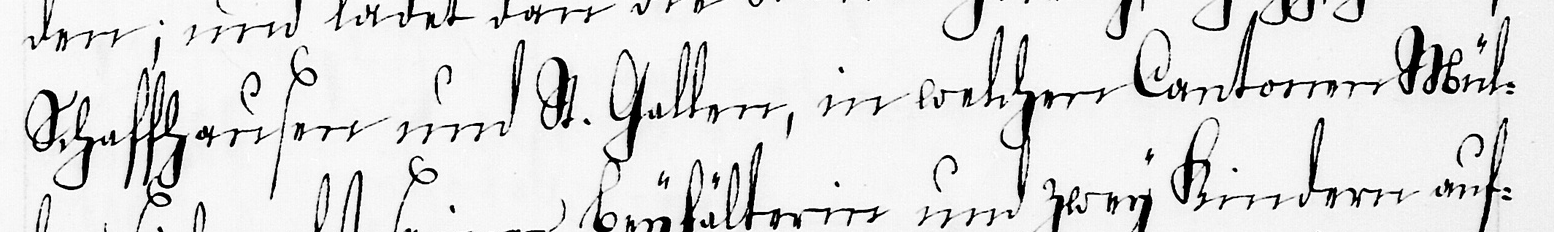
Schaffhausen und St. Gallen, in welchen Cantonen Mül¬
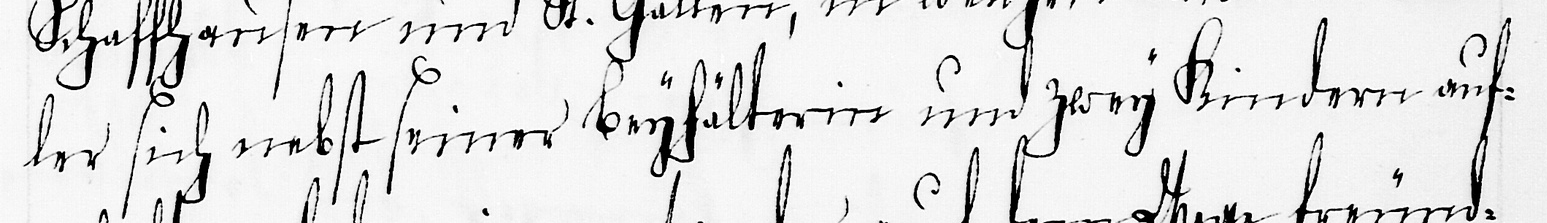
ler sich nebst seiner Beyhälterin und zwey Kindern auf¬
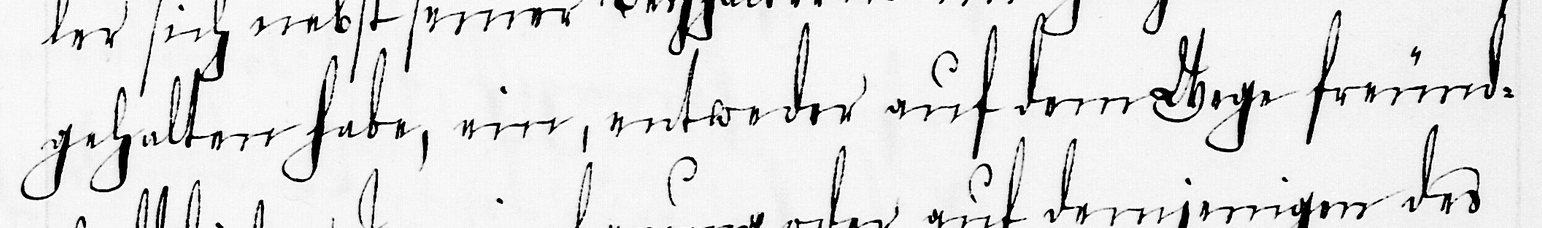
gehalten habe, ein, entweder auf dem Wege freund¬
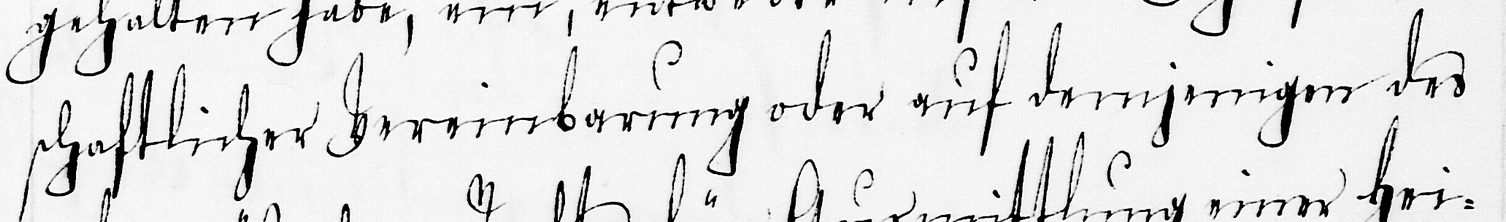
schaftlicher Vereinbarung oder auf demjenigen des
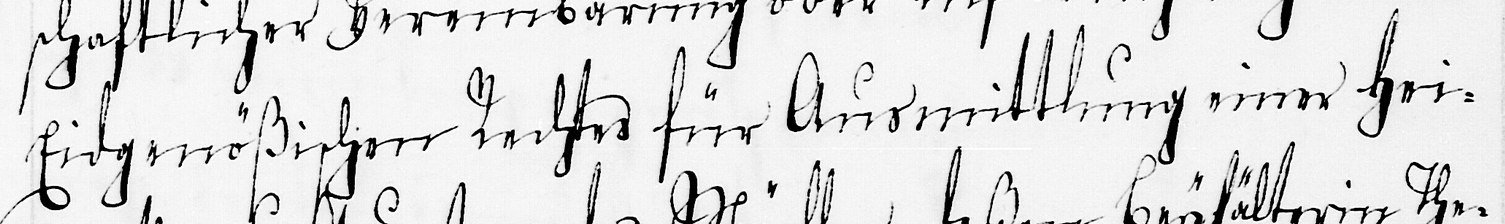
Eidgenößischen Rechtes für Ausmittlung einer Hei¬
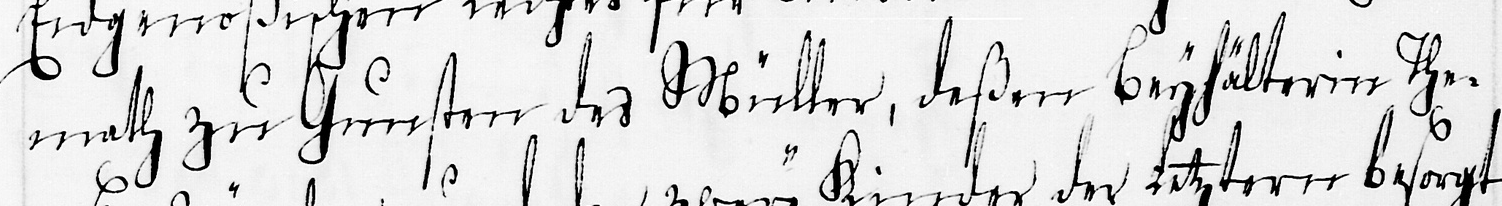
math zu Gunsten des Müller, deßen Beyhälterin The¬
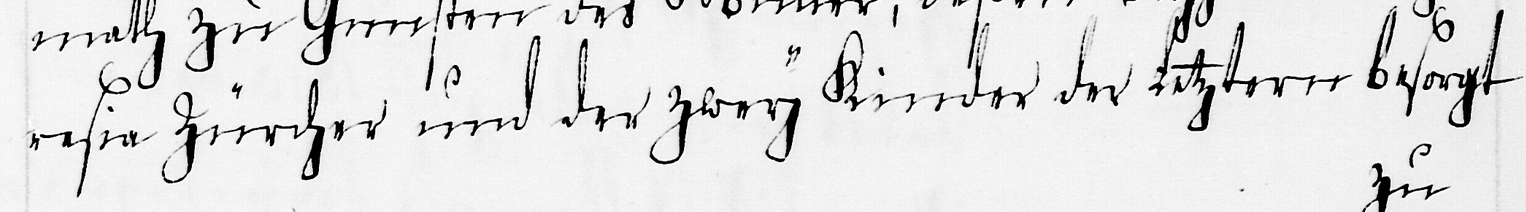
resia Zürcher und der zwey Kinder der Letztern besorgt
